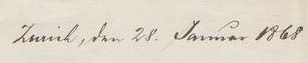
Zürich, den 28. Januar 1868
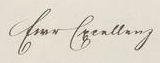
Ewr Excellenz
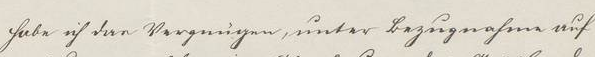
habe ich das Vergnügen, unter Bezugnahme auf
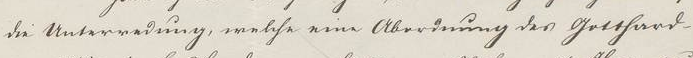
die Unterredung, welche eine Abordnung des Gotthard -
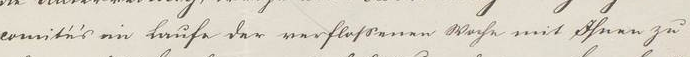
comité's im Laufe der verflossenen Woche mit Ihnen zu
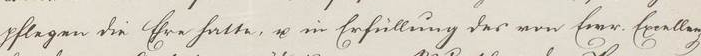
pflegen die Ehre hatte, & in Erfüllung des von Ewr. Excellenz
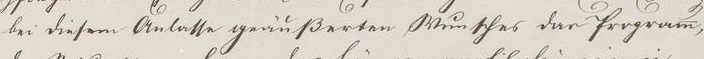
bei diesem Anlasse geäußerten Wunsches das Programm,
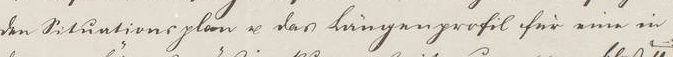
den Situationsplan & das Längenprofil für eine in
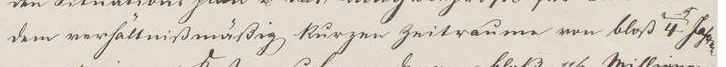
dem verhältnißmäßig kurzen Zeitraum von bloß 4–5 Jahren
